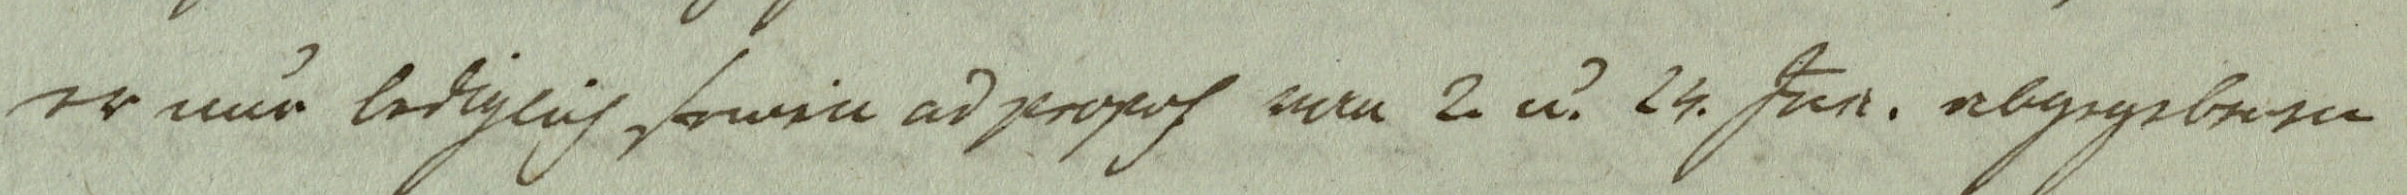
er nur lediglich sowie ad propos. vom 2. u. 24. Jun. abgegebenen
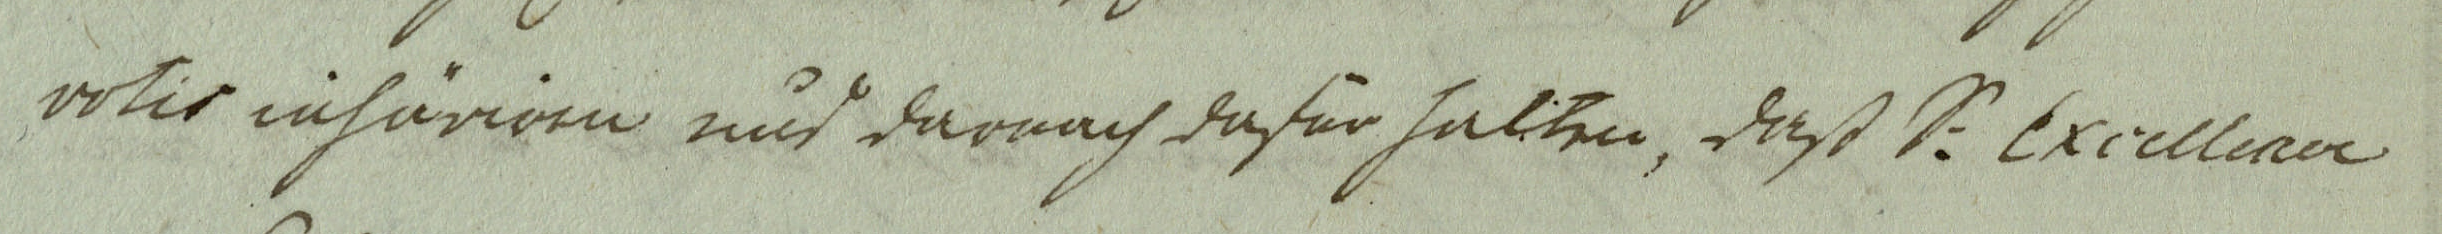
votis inhäriren und darnach dafür halten, daß Sr. Excellence
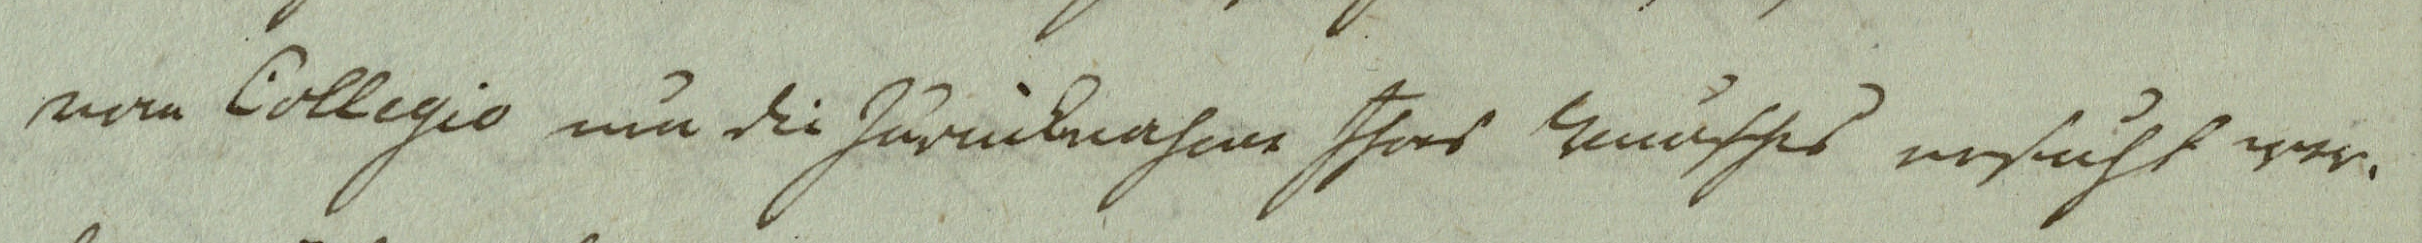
vom Collegio um die Zurücknahme Ihres Wunsches ersucht wer¬
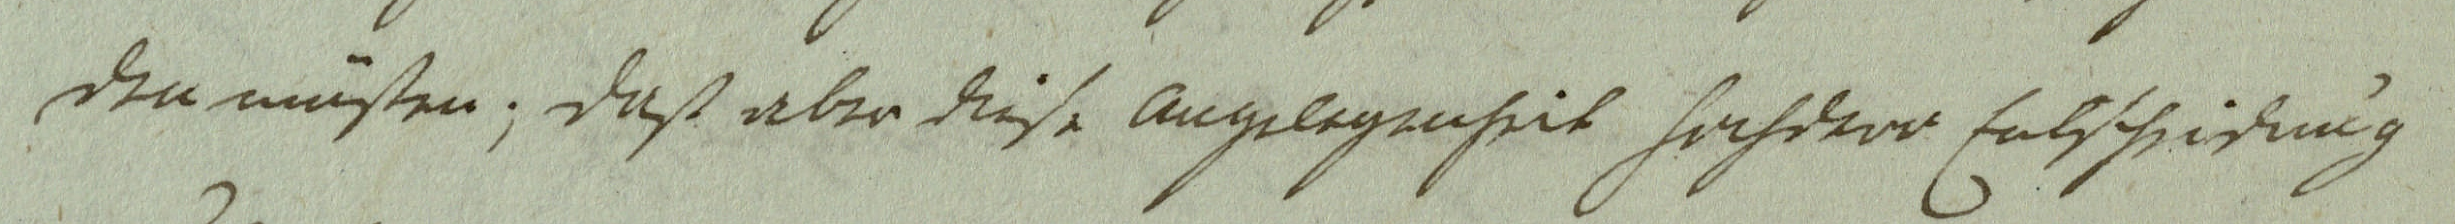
den müsten; daß aber diese Angelegenheit hochdero Entscheidung
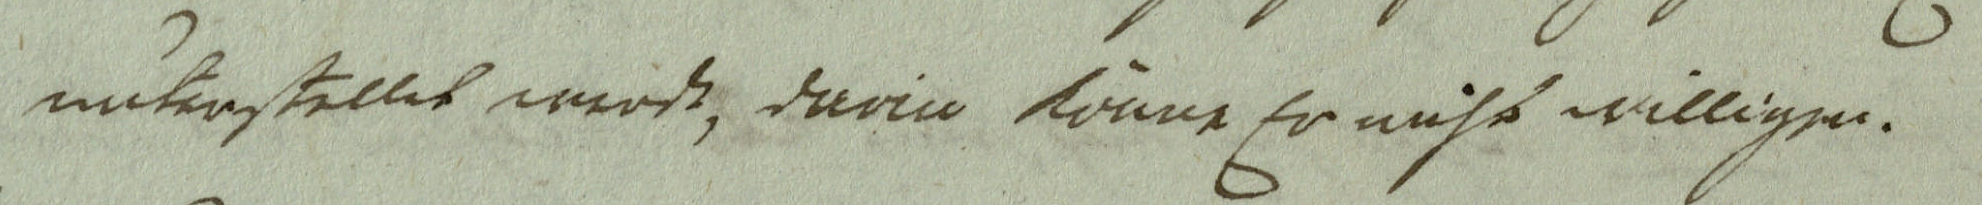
unterstellet werde, darin könne Er nicht willigen.
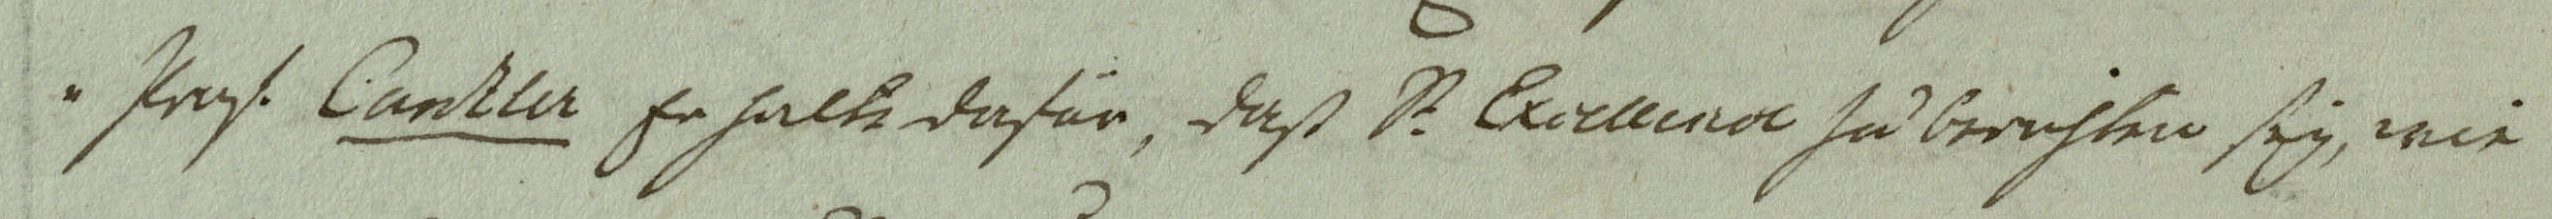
Prof. Canzler Er halte dafür, daß Sr. Excellence zu berichten seÿ, wie
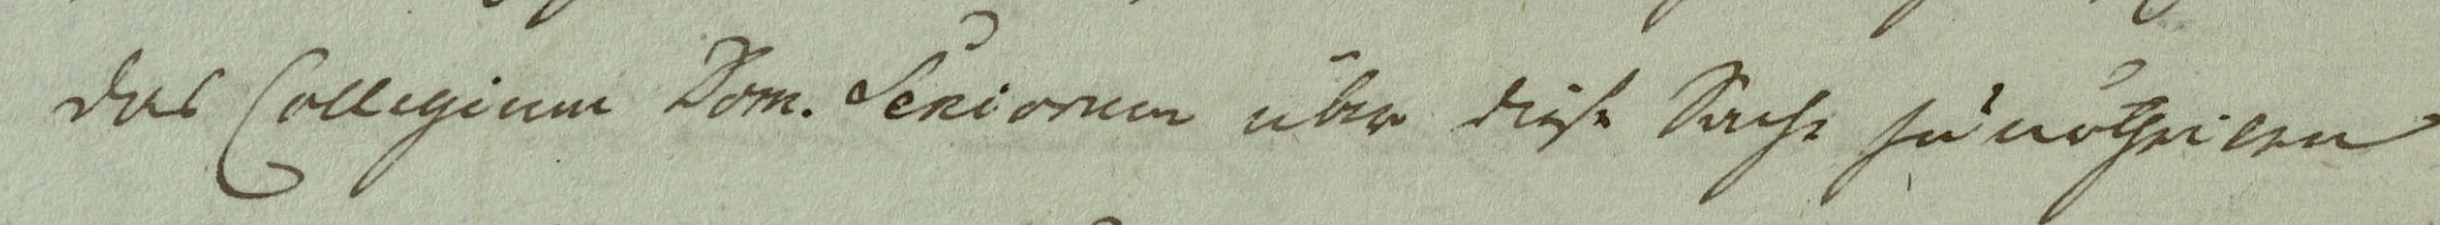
das Collegium Dom. Seniorum über diese Sache zu ertheilen
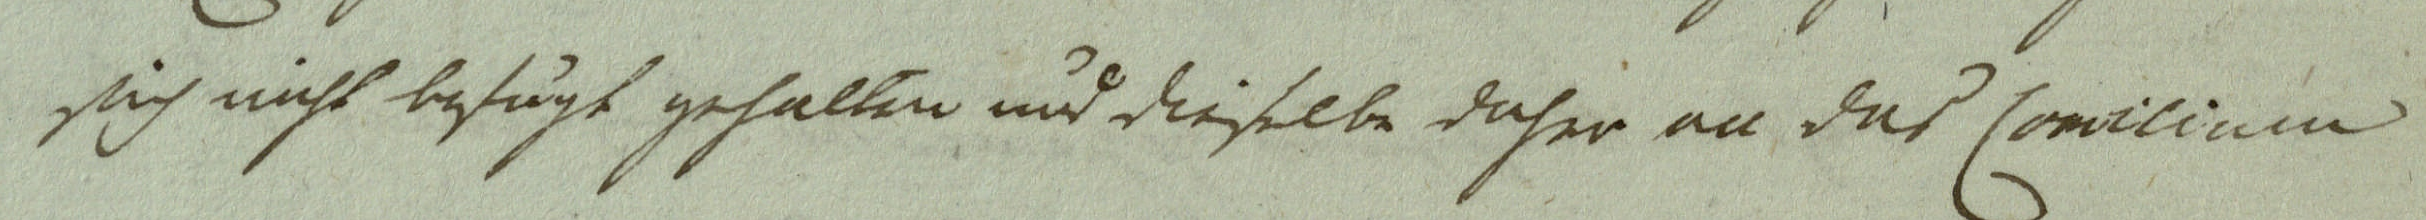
sich nicht befugt gehalten und dieselbe daher an das Concilium
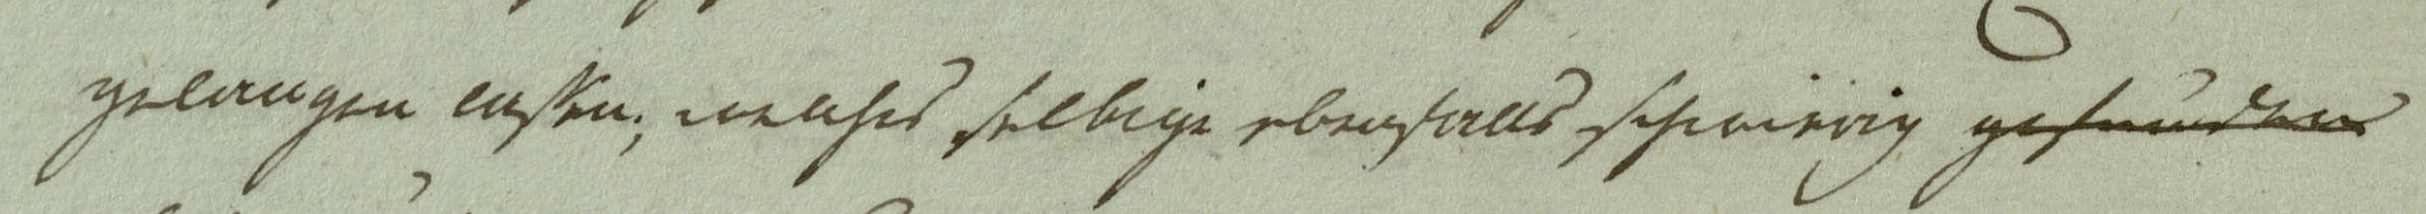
gelangen lassen; welches selbige ebenfalls schwierig gefunden
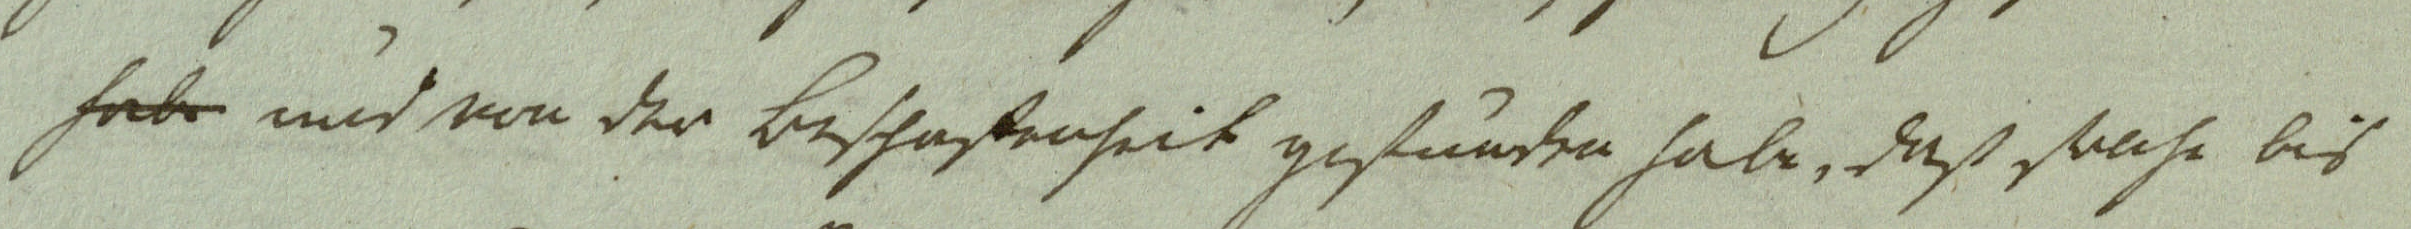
habe und von der Beschaffenheit gefunden habe, daß solche bis
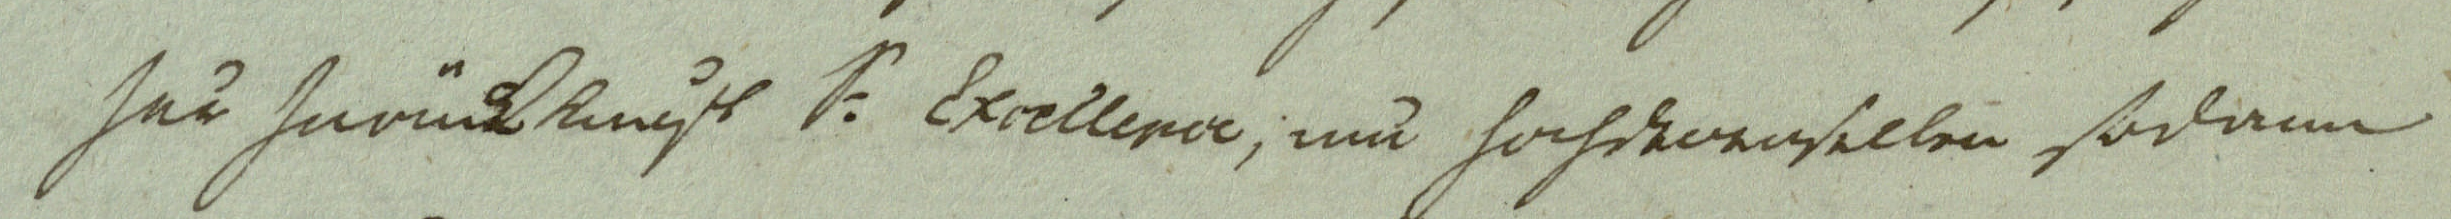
zur Zurückkunft Sr. Excellence, um hochdenenselben sodann
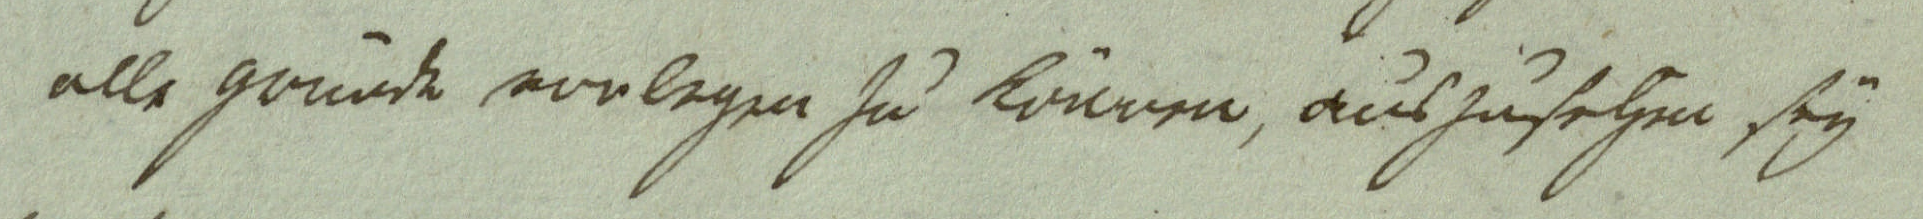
alle gründe vorlegen zu können, auszusetzen seÿ.
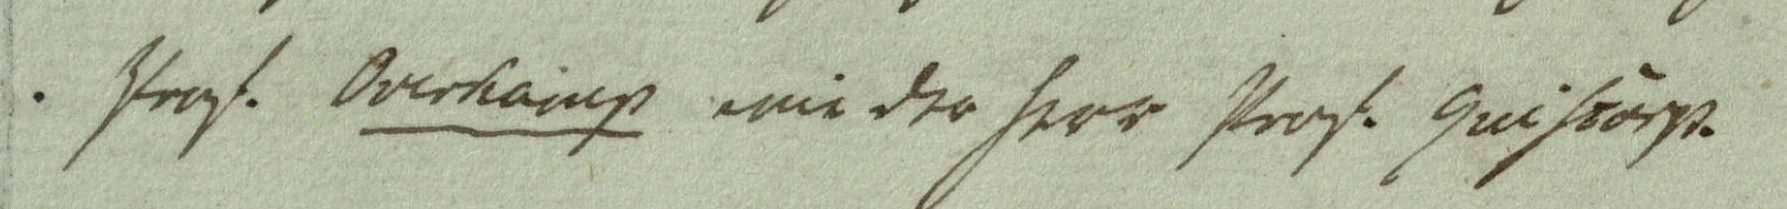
Prof. Overkamp wie der herr Prof. Quistorp.
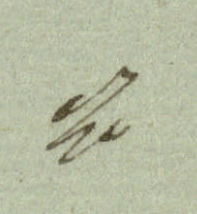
dh.
